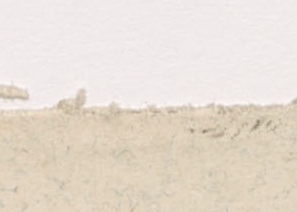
Gestelle
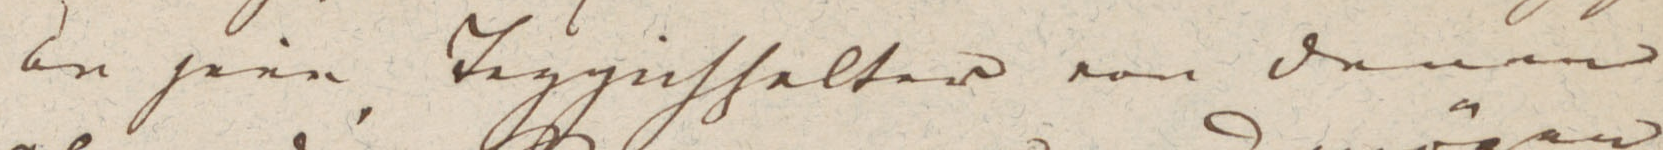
an jene Teppichhalter von denen
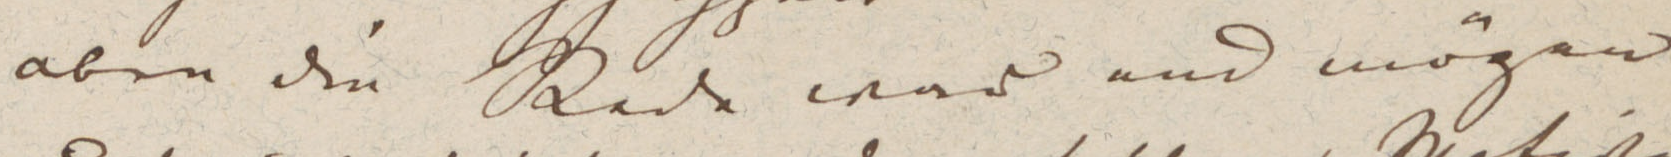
oben die Rede war und mögen
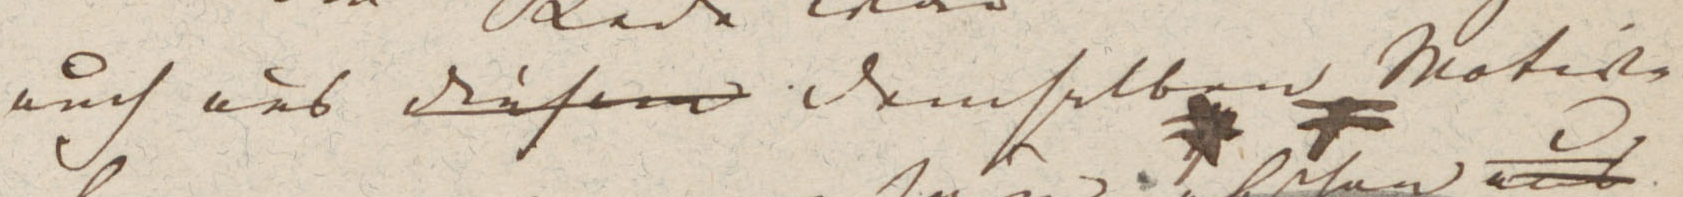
auch aus diesem demselben Motive
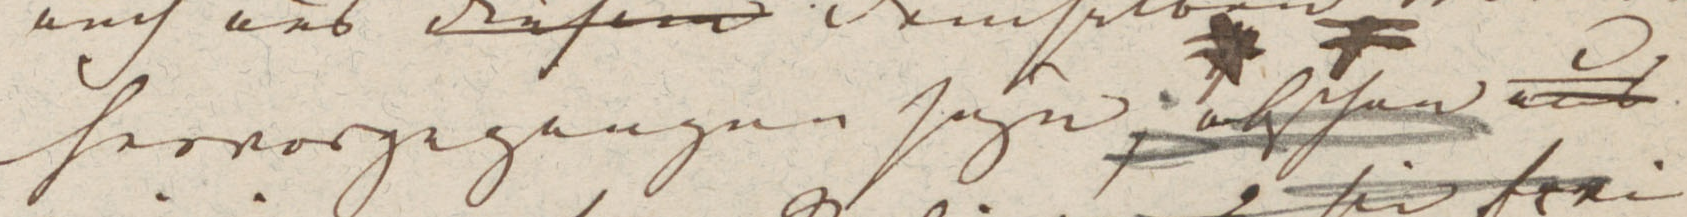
hervorgegeangen seyn, obschon % % aus
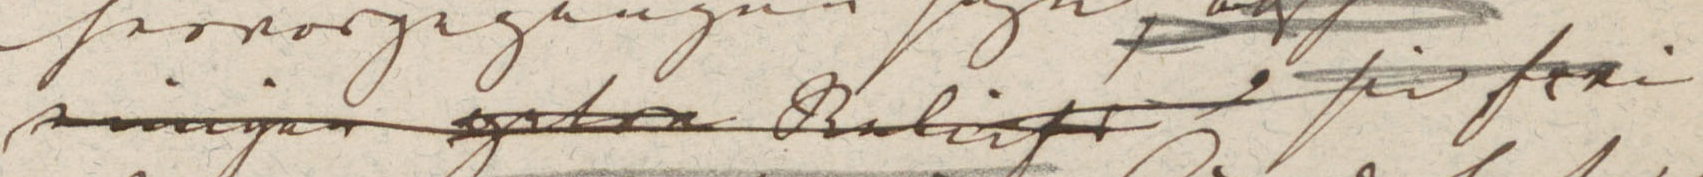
einigen getre Reliefs sie frei
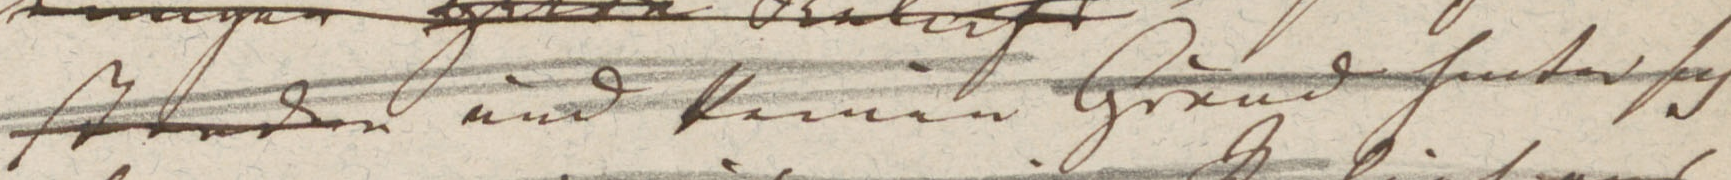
stehen standen und keinen Grund hinter sich
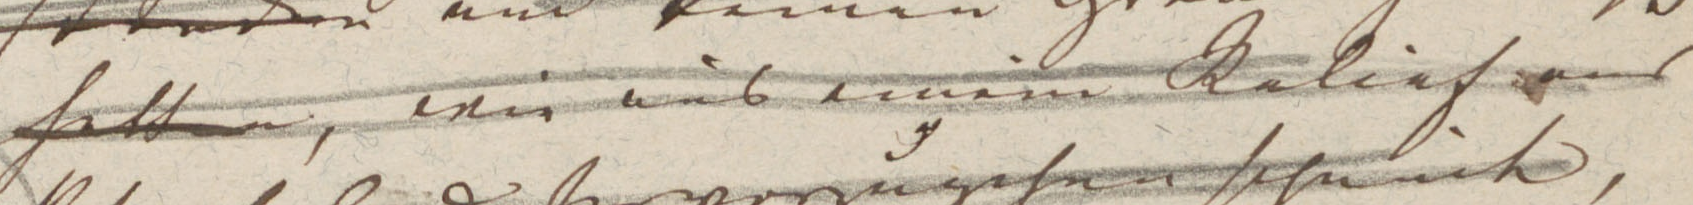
hatten, wie aus einem Relief aus
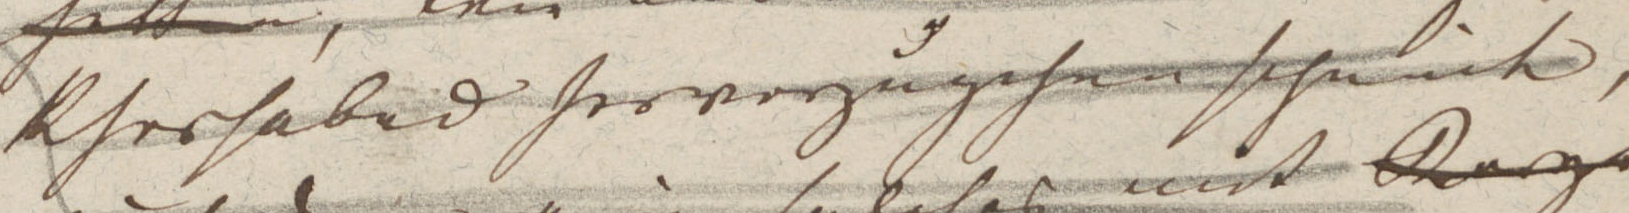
khosabad hervorzugehen scheint,
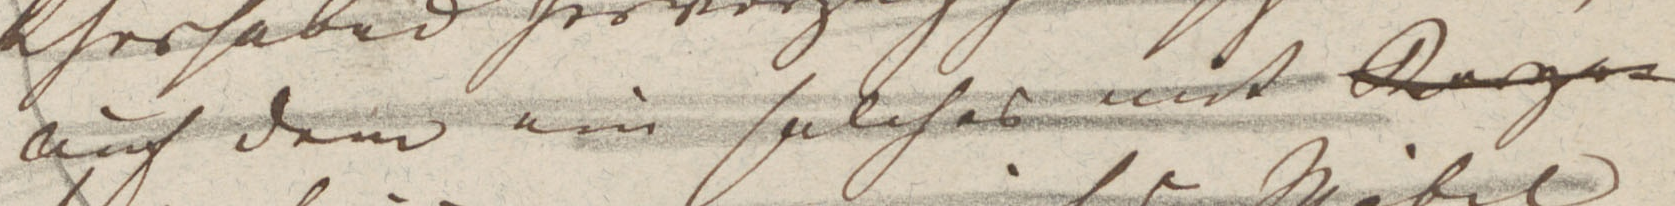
auf dem ein solches mit Karya-
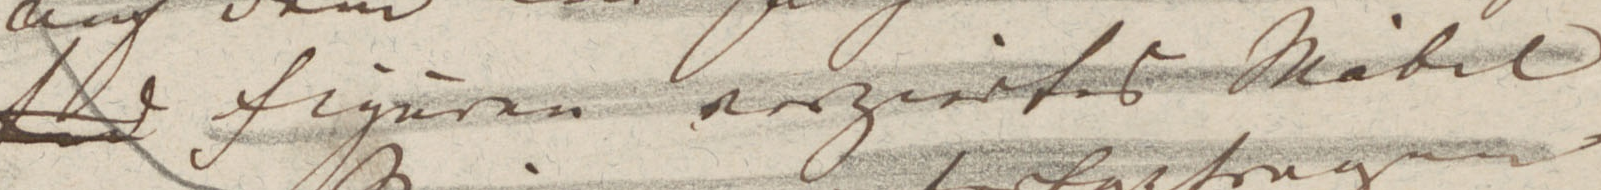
tid Figuren verziertes Möbel
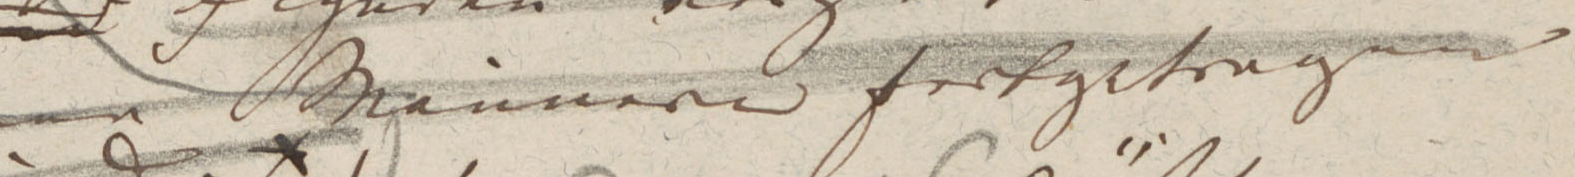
von Männern fortgetragen
